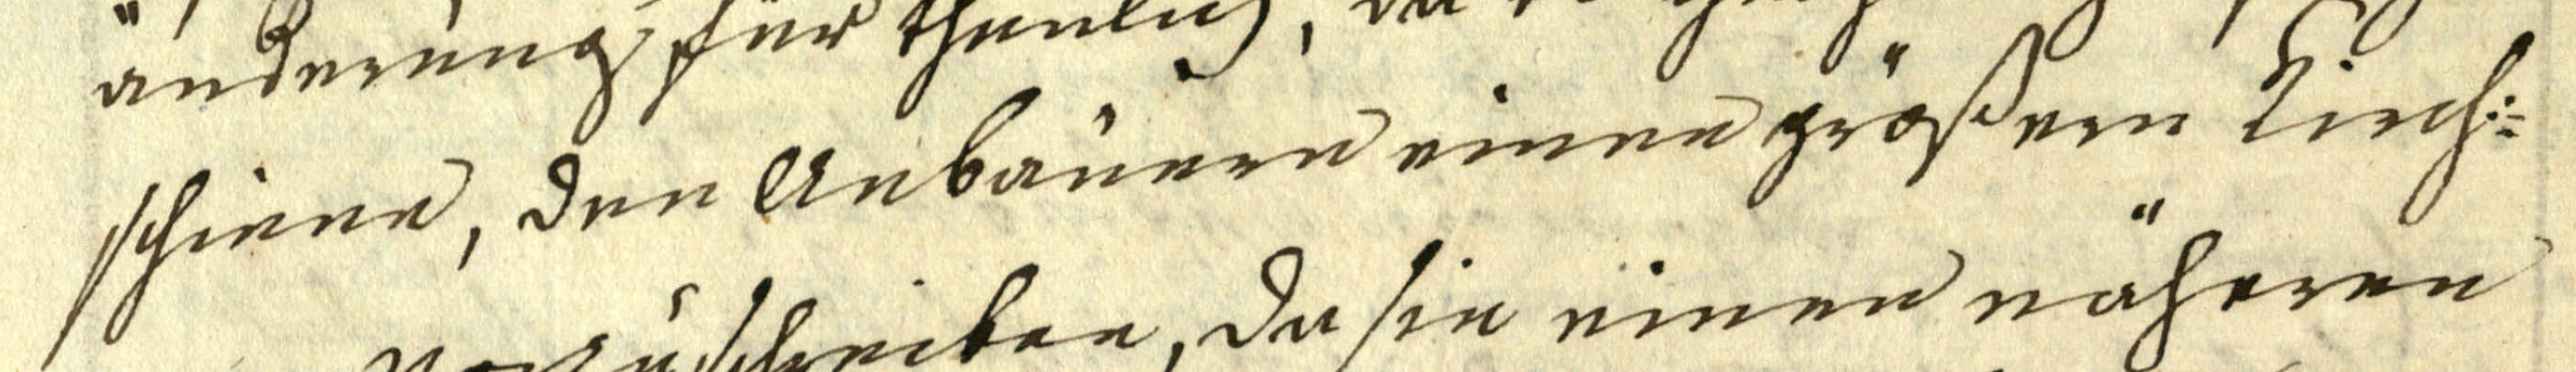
schiene, den Anbauern einen größern Kirch¬
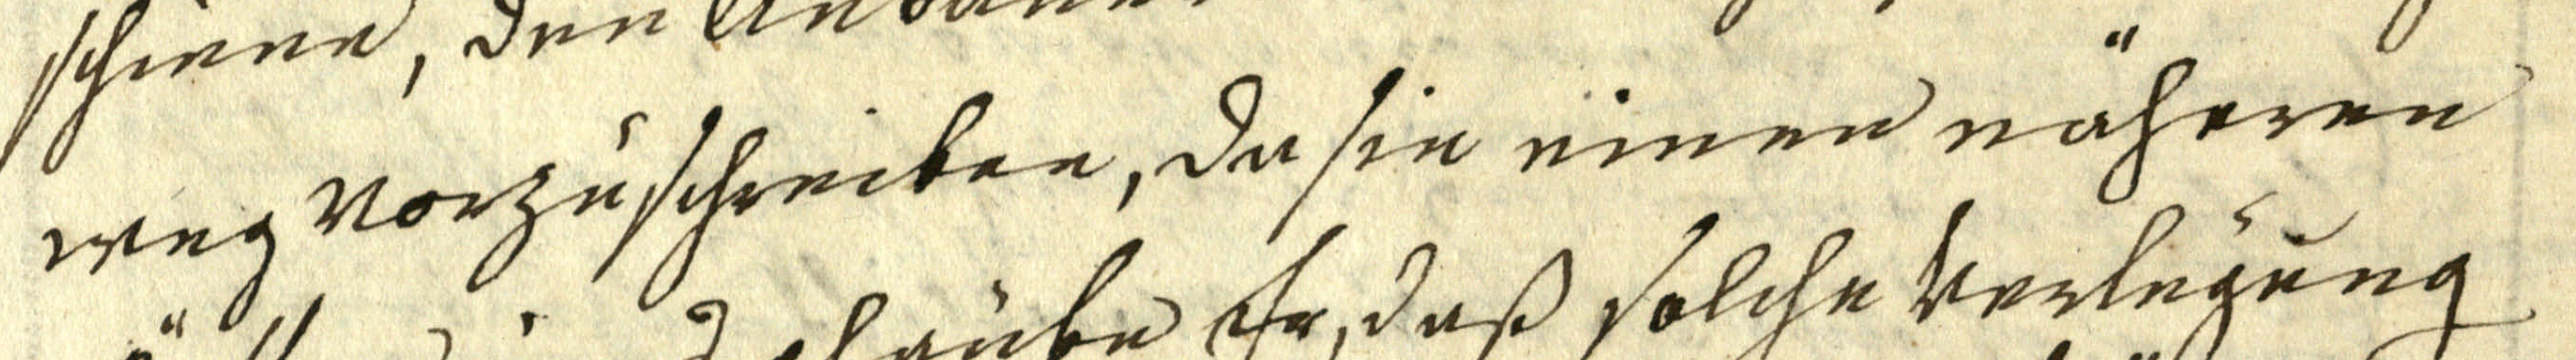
weg vorzuschreiben, da sie einen näheren
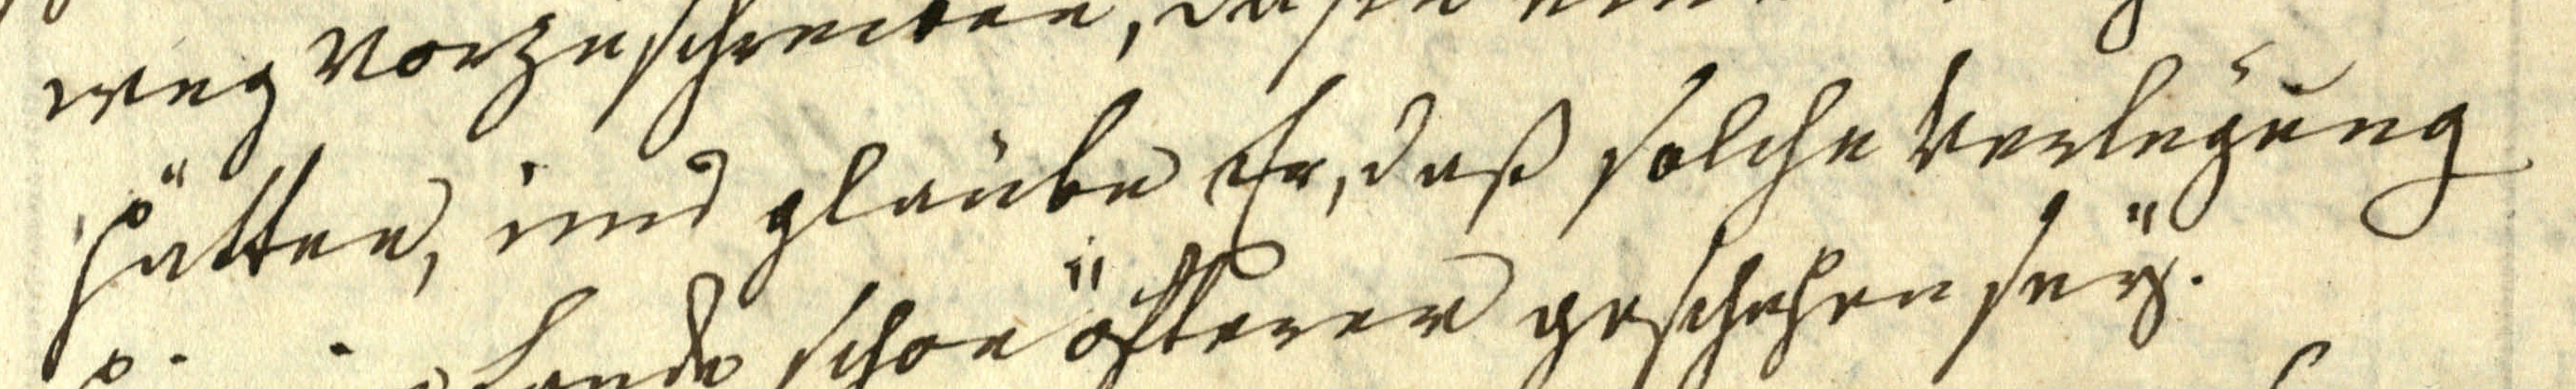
hätten, und glaube Er, daß solche Verlegung
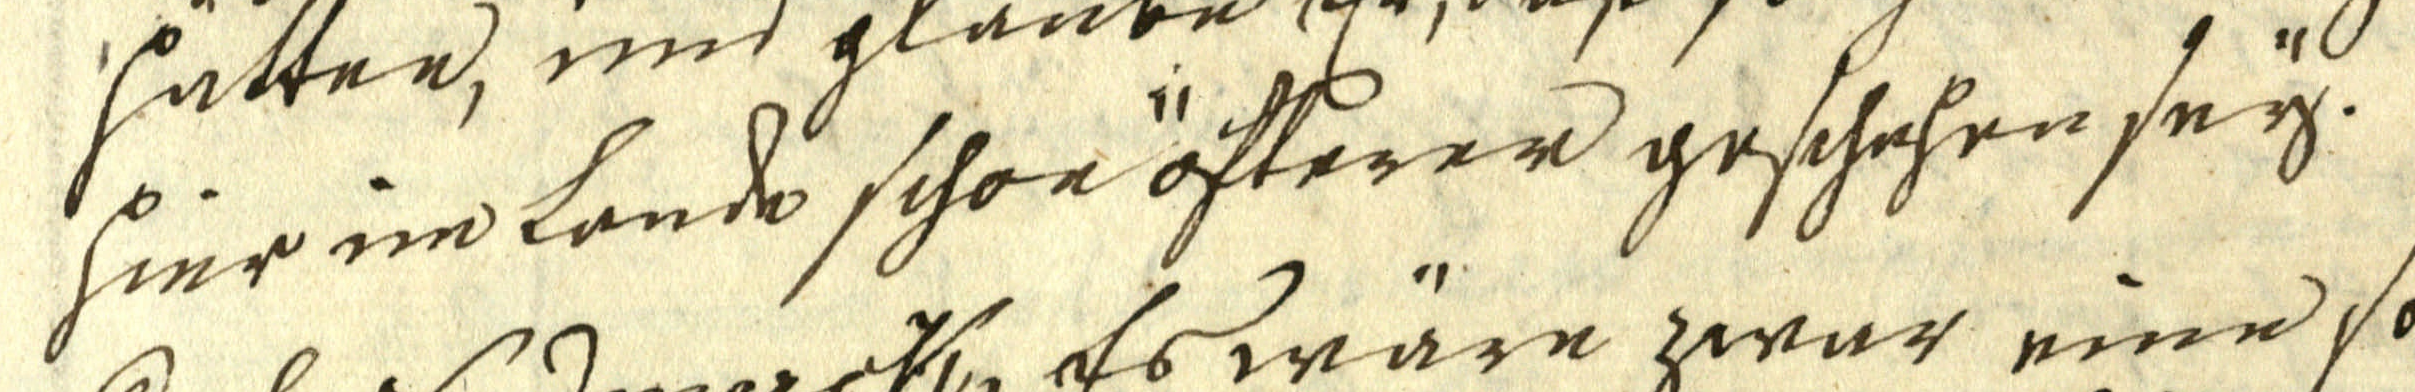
hier im Lande schon öfterer geschehen seÿ.
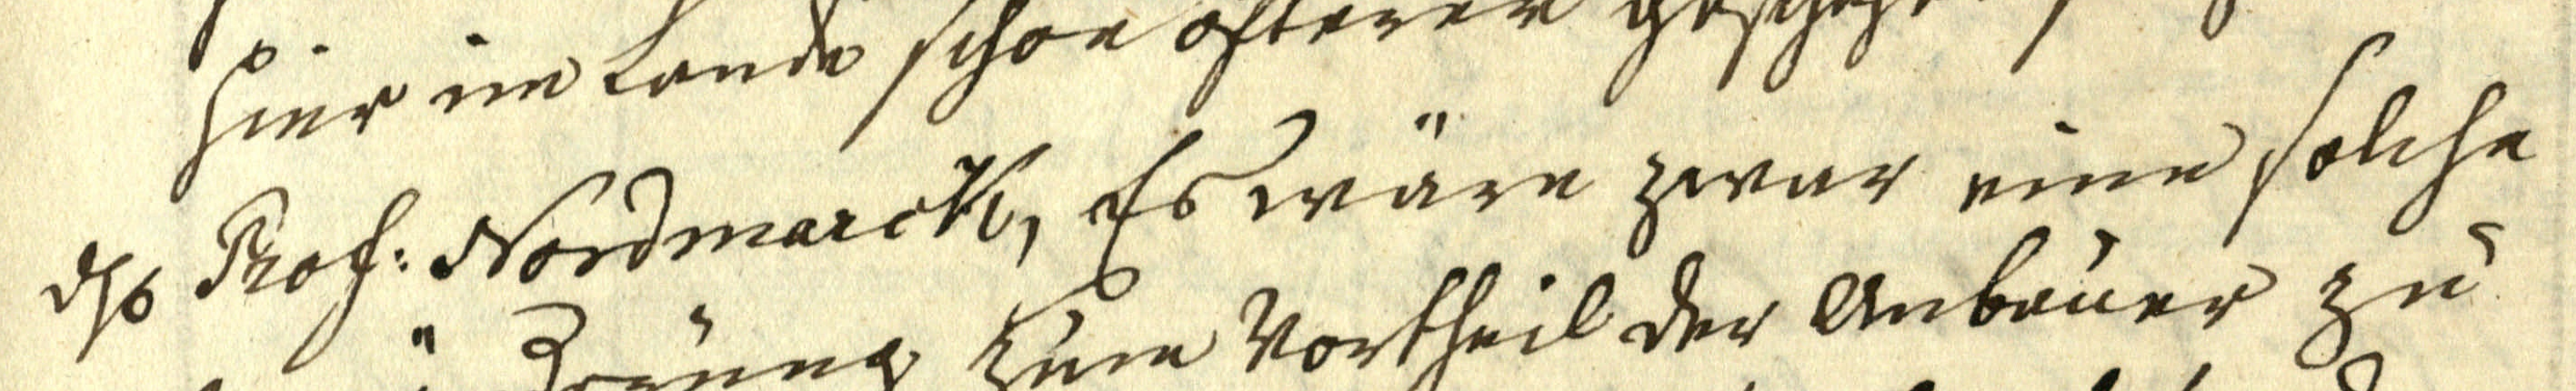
dh Prof. Nordmarck, Es wäre zwar eine solche
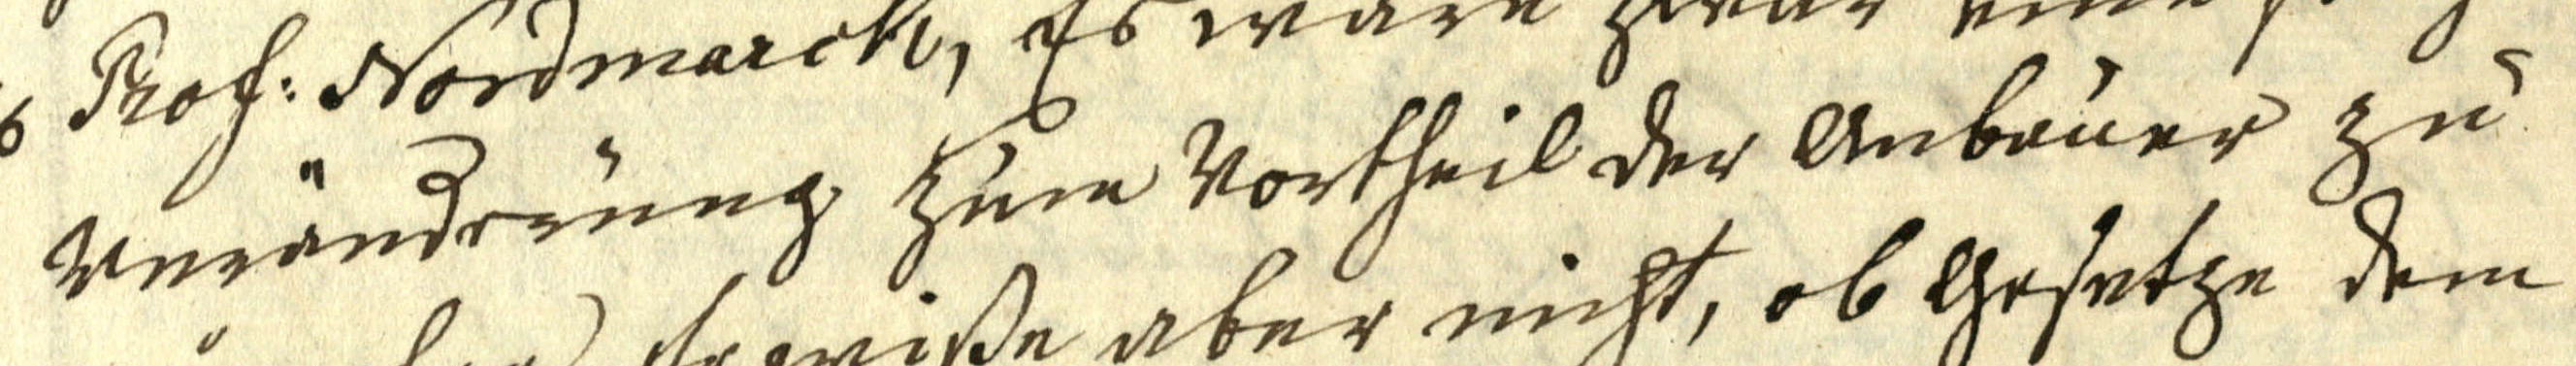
Veränderung zum Vortheil der Anbauer zu
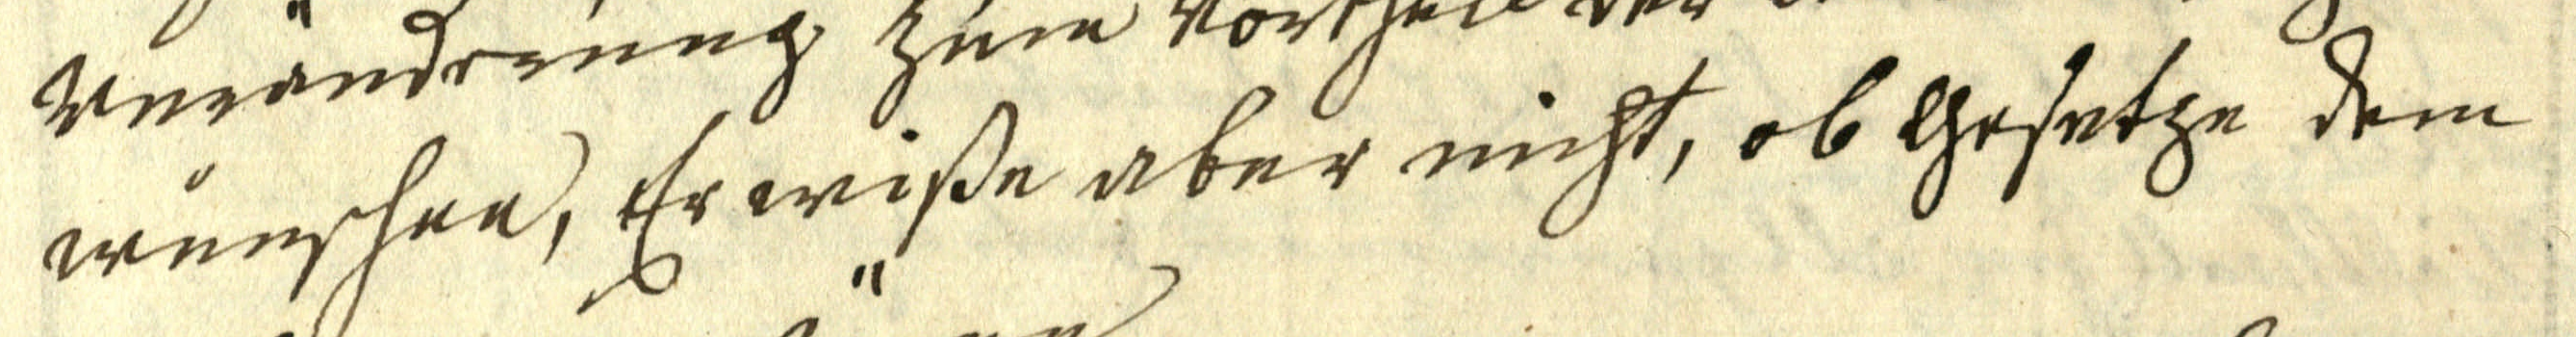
wünschen, Er wiße aber nicht, ob Gesetze dem
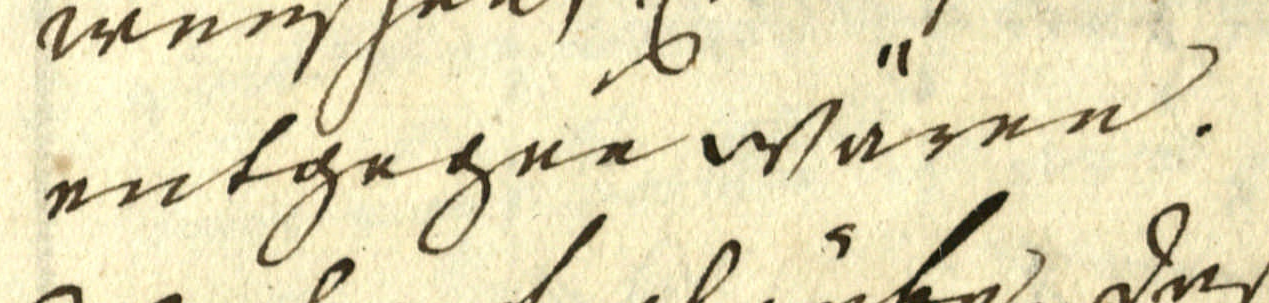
entgegen wären.
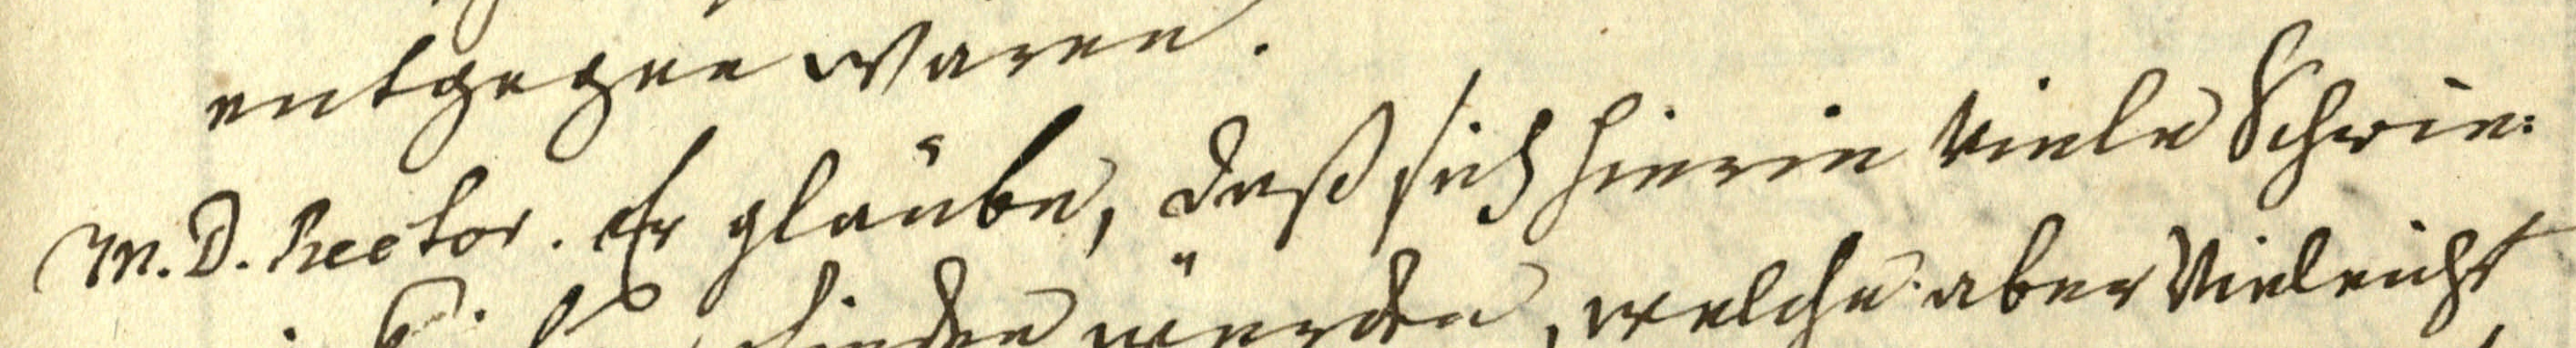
M. D. Rector. Er glaube, daß sich hierin viele Schwie¬
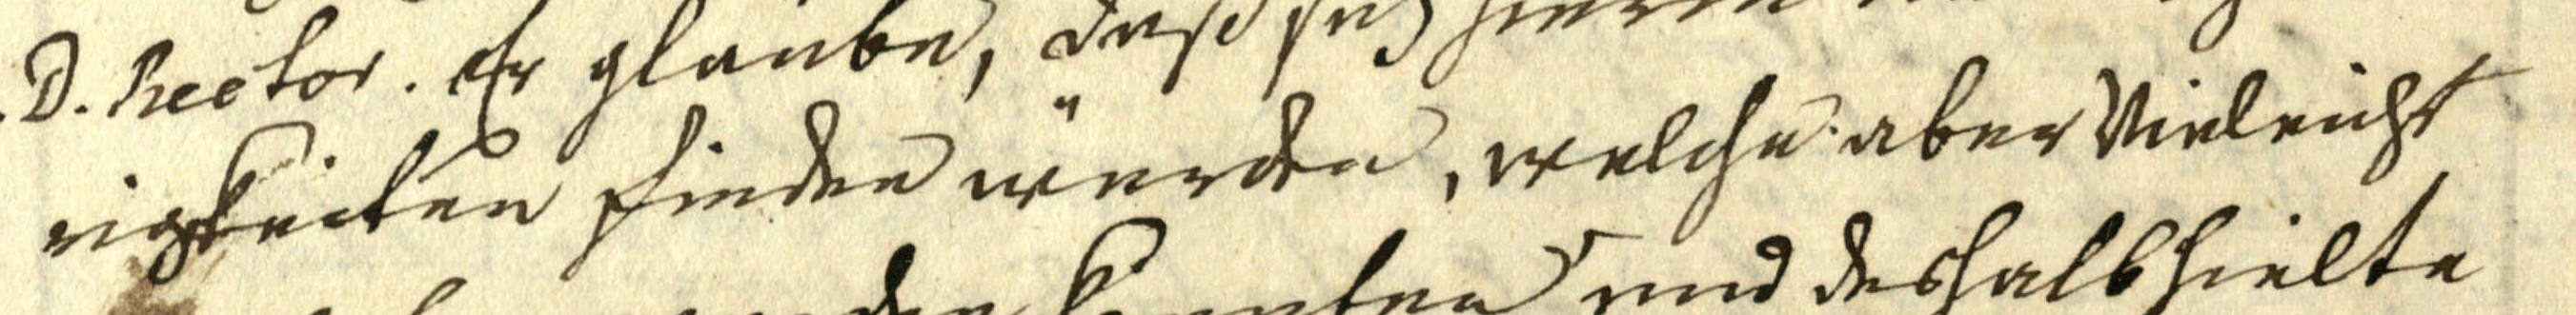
rigkeiten finden würden, welche aber vieleicht
